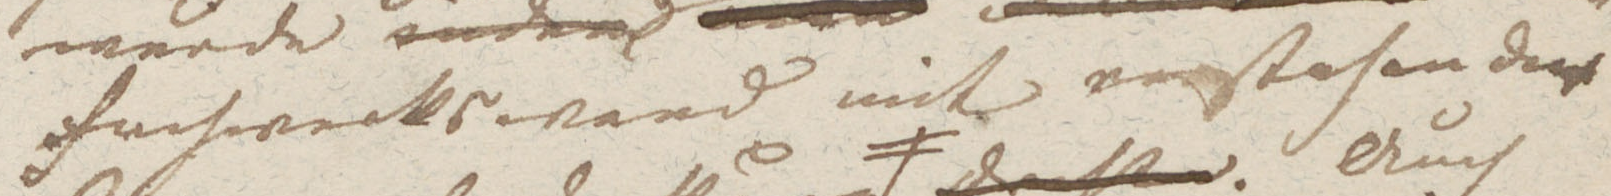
Fachwerkswand mit vorstehendemr
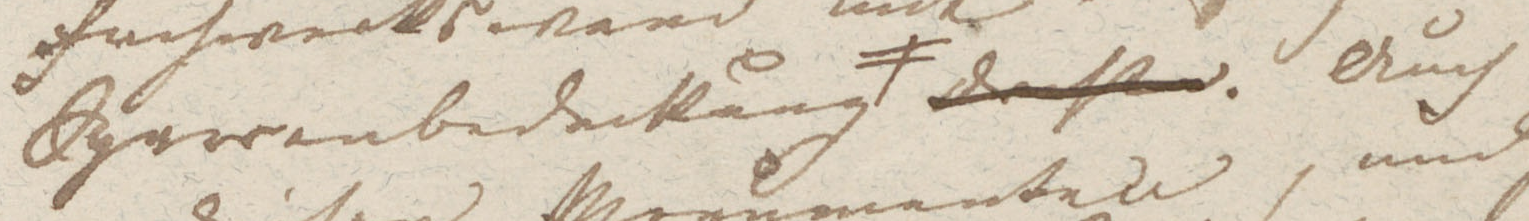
Sparrenbedeckung % drehte. Auch
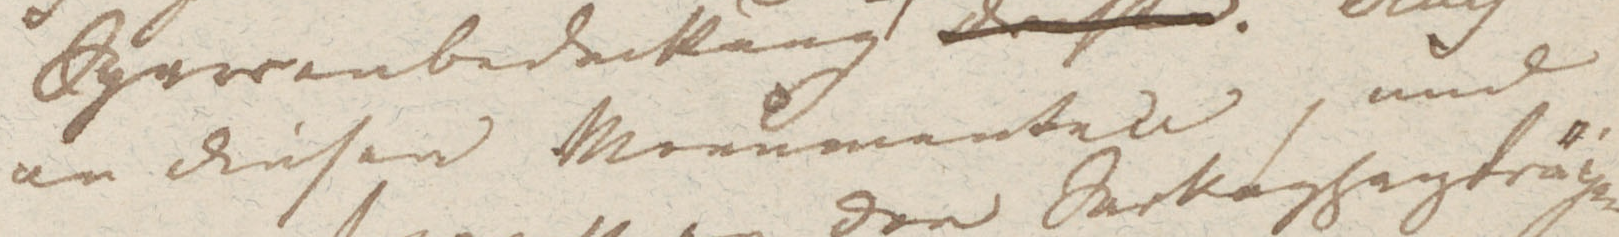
an diesen Monumenten, und
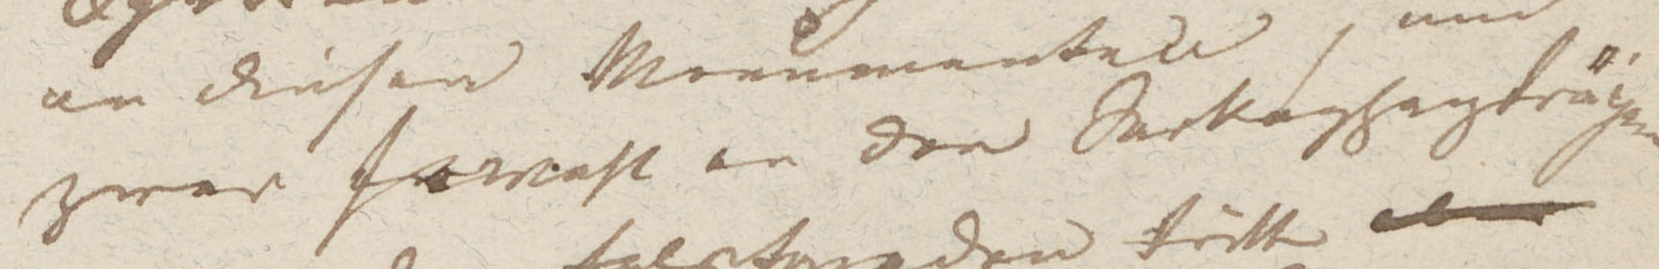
zwar sowohl an den Sarkophagträgern
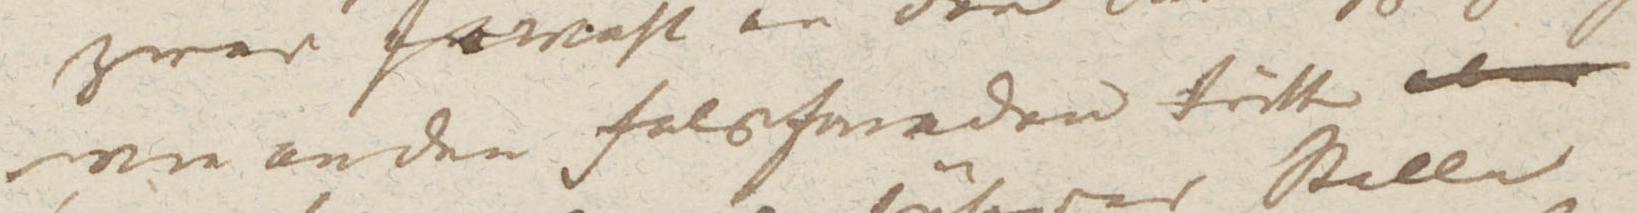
wie an den Felsfacaden tritt aber
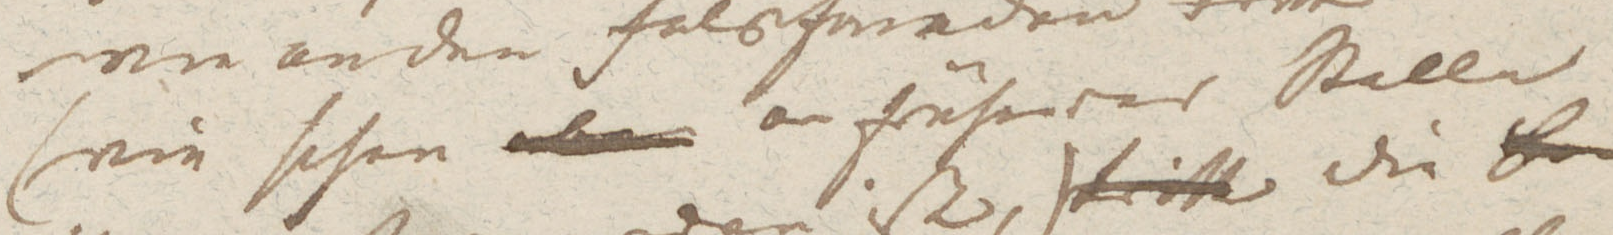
(wie schon oben an früherer Stelle
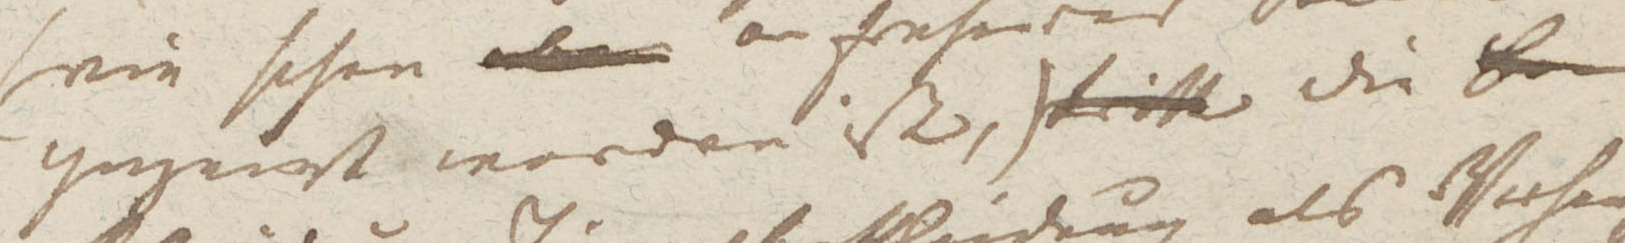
gezeigt worden ist,) tritt die Be-
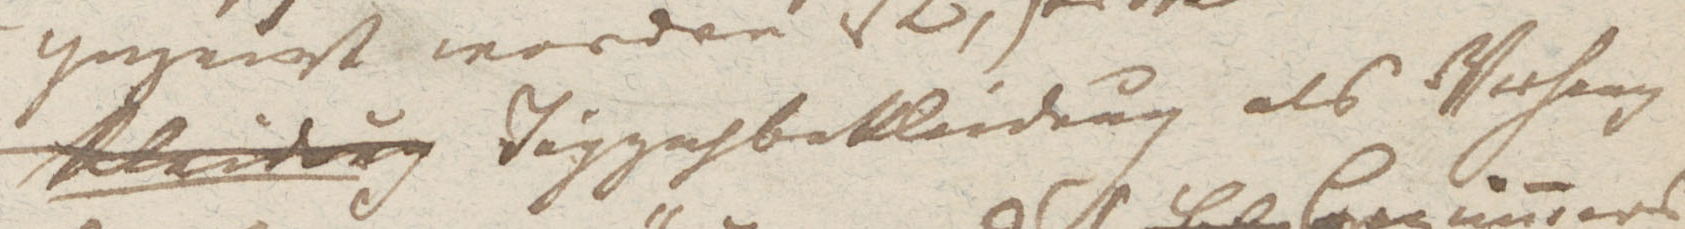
kleidung Teppichbekleidung als Vorhang
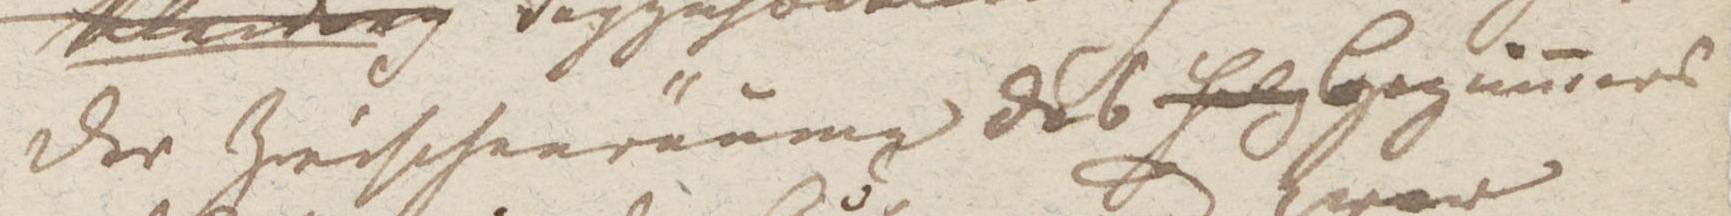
der Zwischenräume des HolzgGezimmers
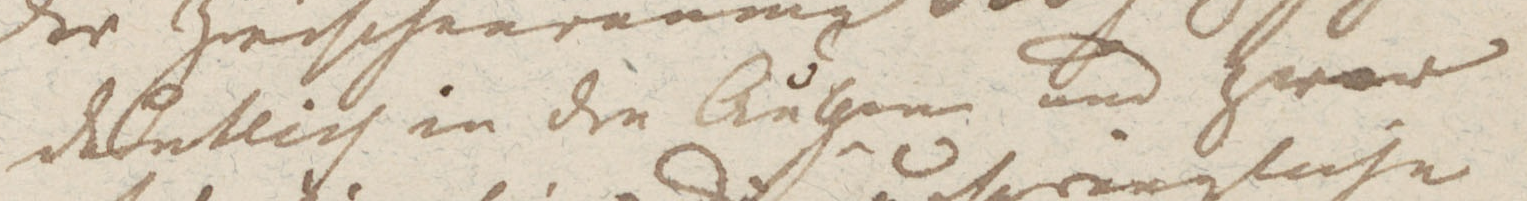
deutlich in die Augen und zwar
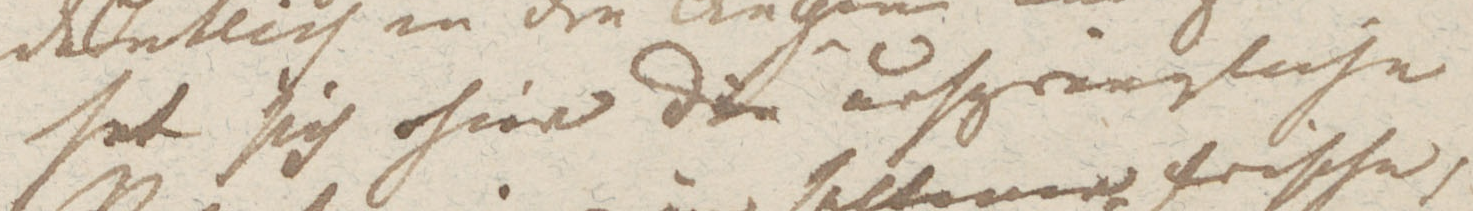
hat sich hier die ursprüngliche
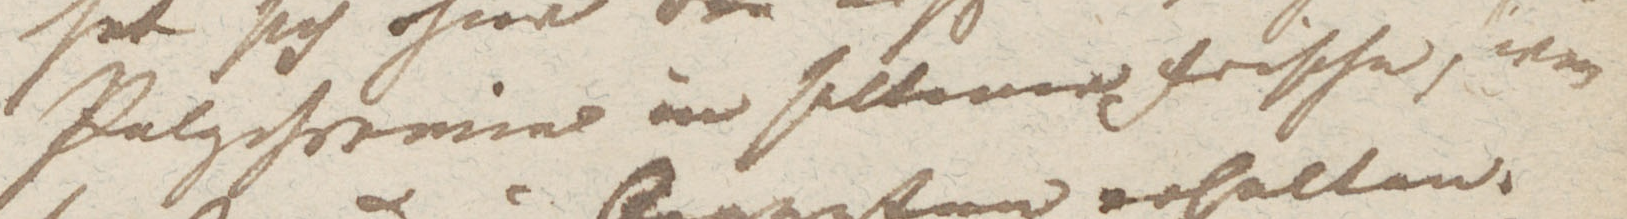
Polychromie in seltener Frische, wie
